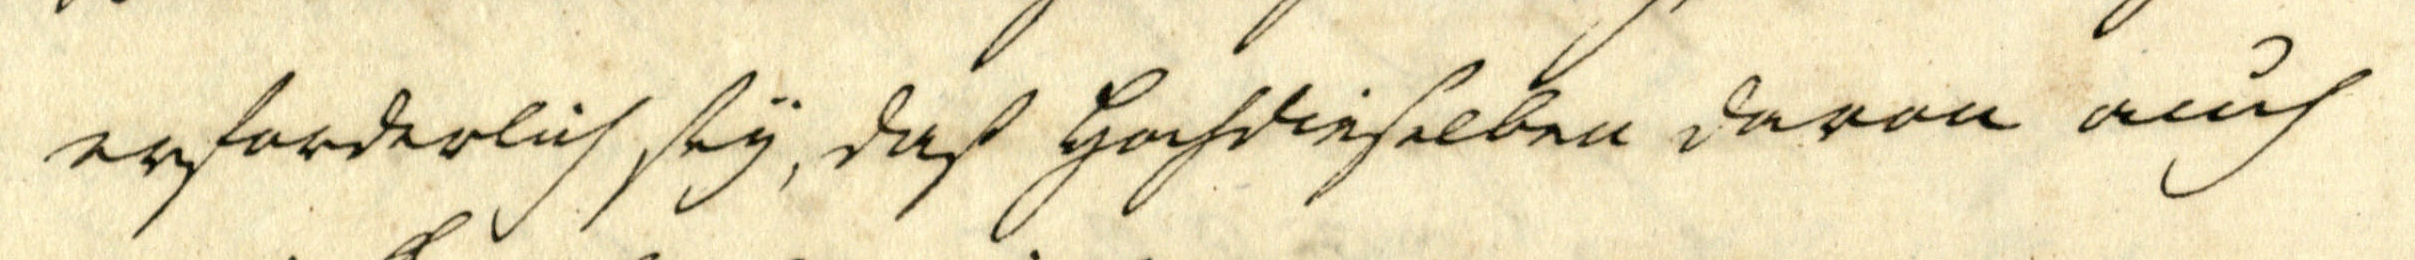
erforderlich seÿ, daß Hochdieselben davon auch
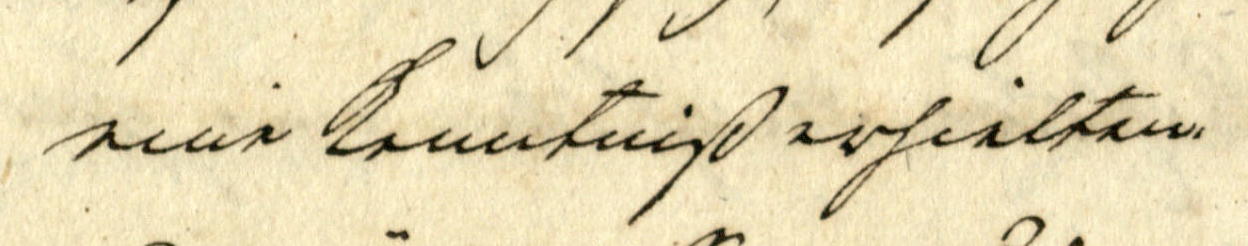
eine Kenntniß erhielten.
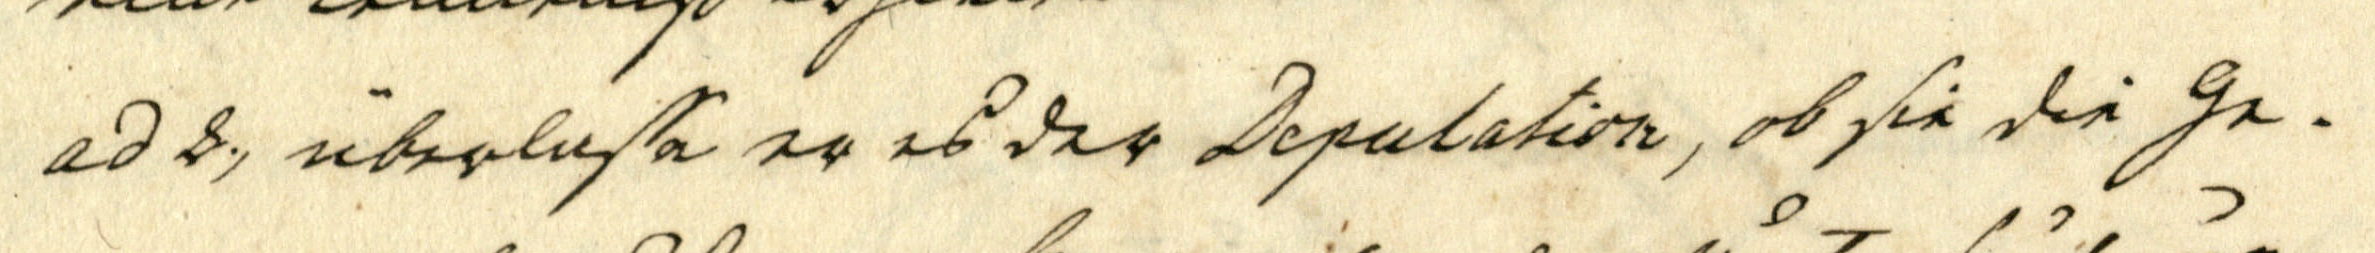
ad 2., überlasse er es der Deputation, ob sie die Ge¬
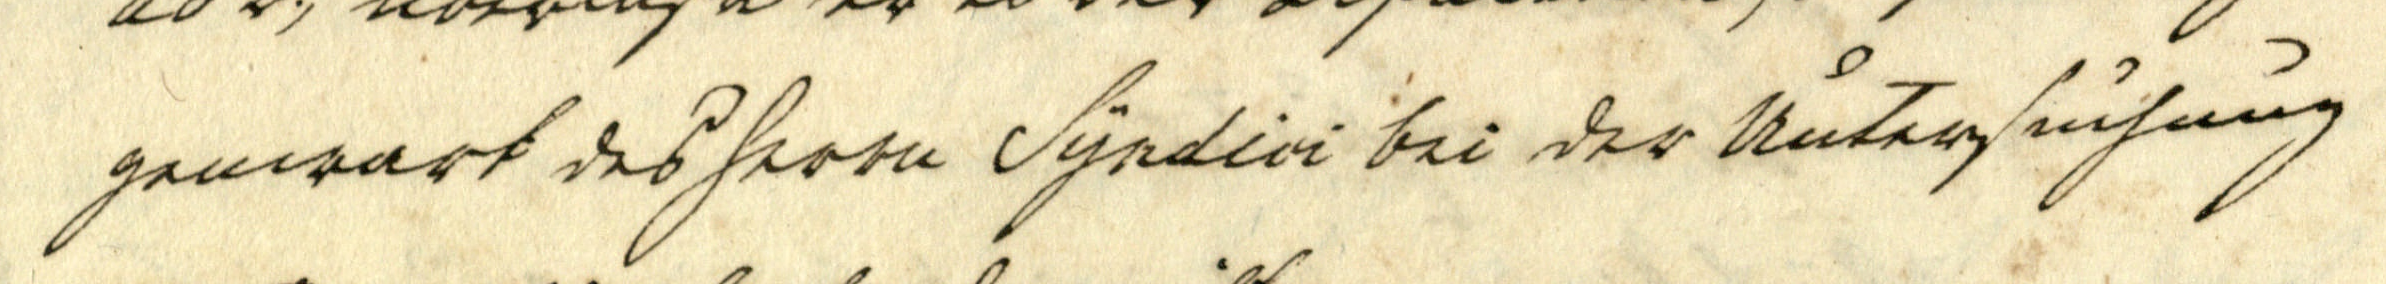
genwart des Herrn Sÿndici bei der Untersuchung
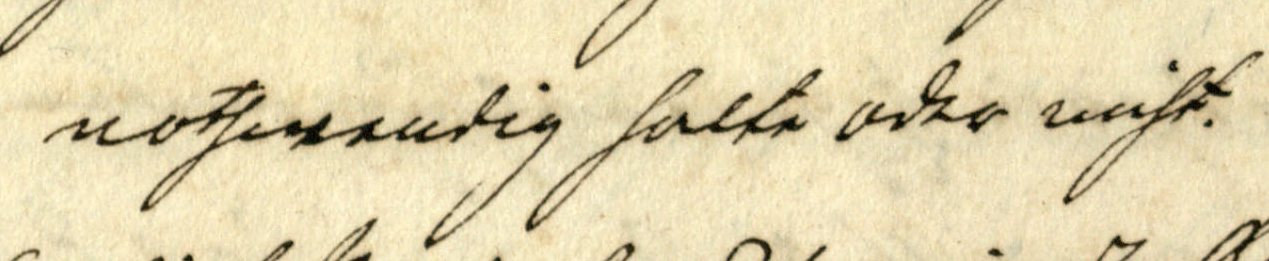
nothwendig halte oder nicht.
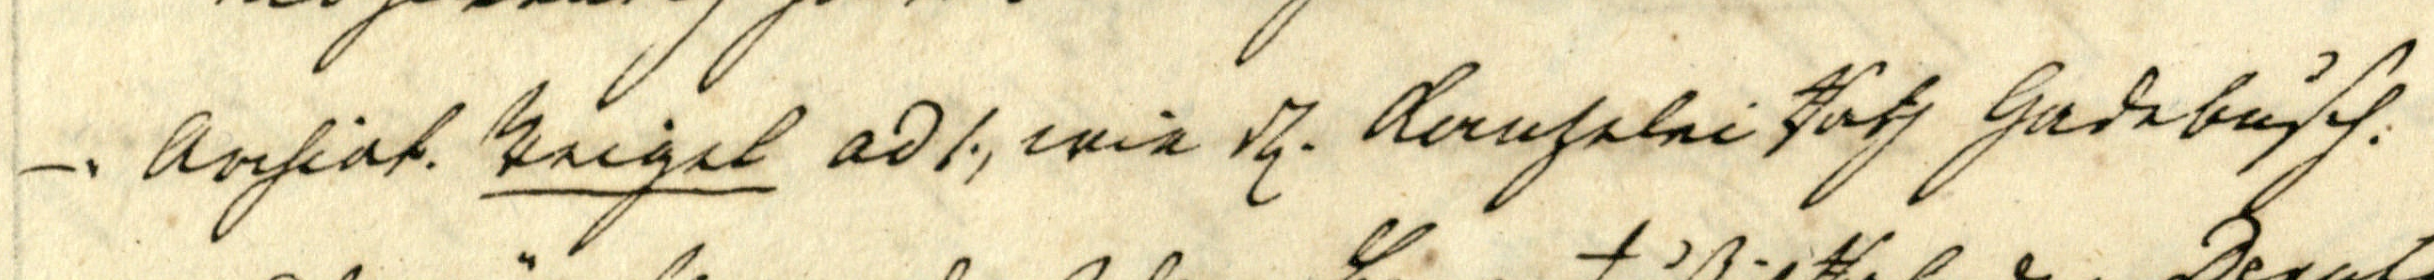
Archiat. Weigel ad 1., wie dh. Kanzelei Rath Gadebusch.
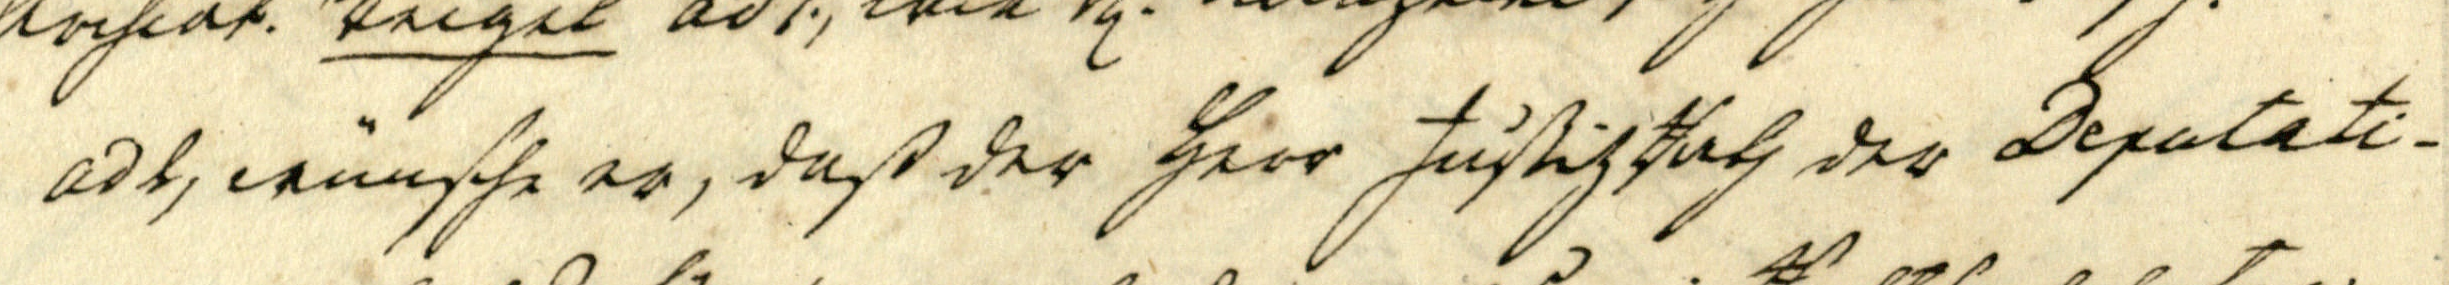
ad 2, wünsche er, daß der Herr Justiz Rath der Deputati¬
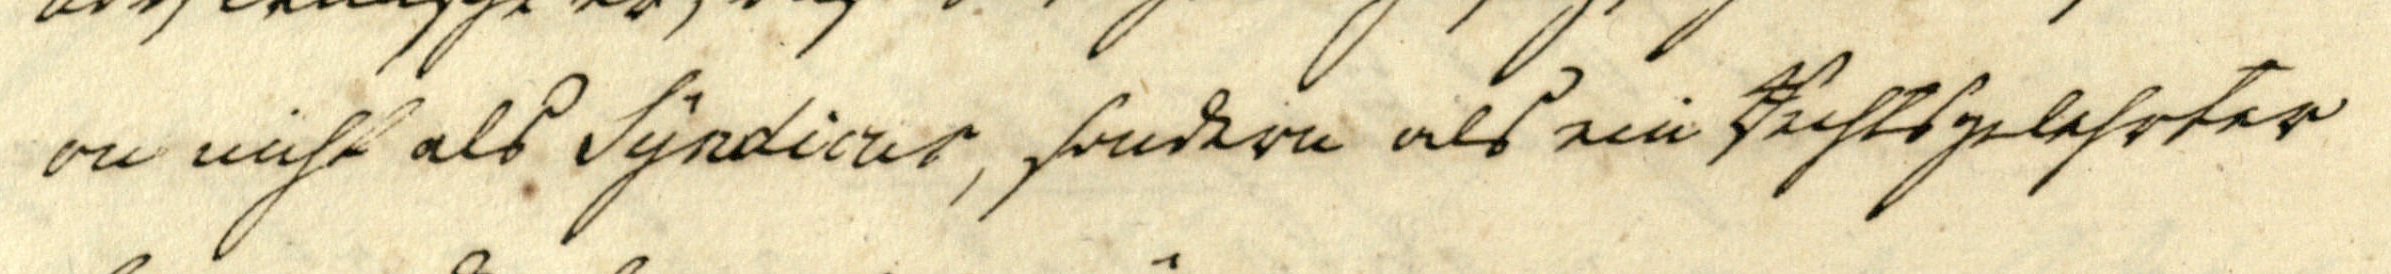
on nicht als Sÿndicus, sondern als ein Rechtsgelehrter
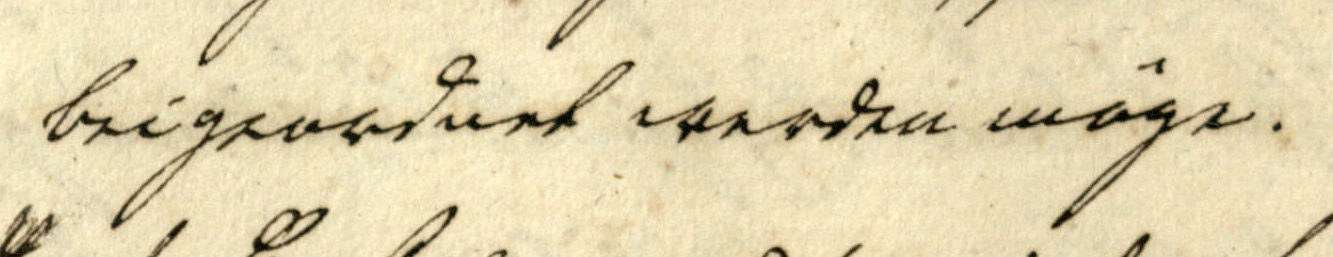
beigeordnet werden möge.
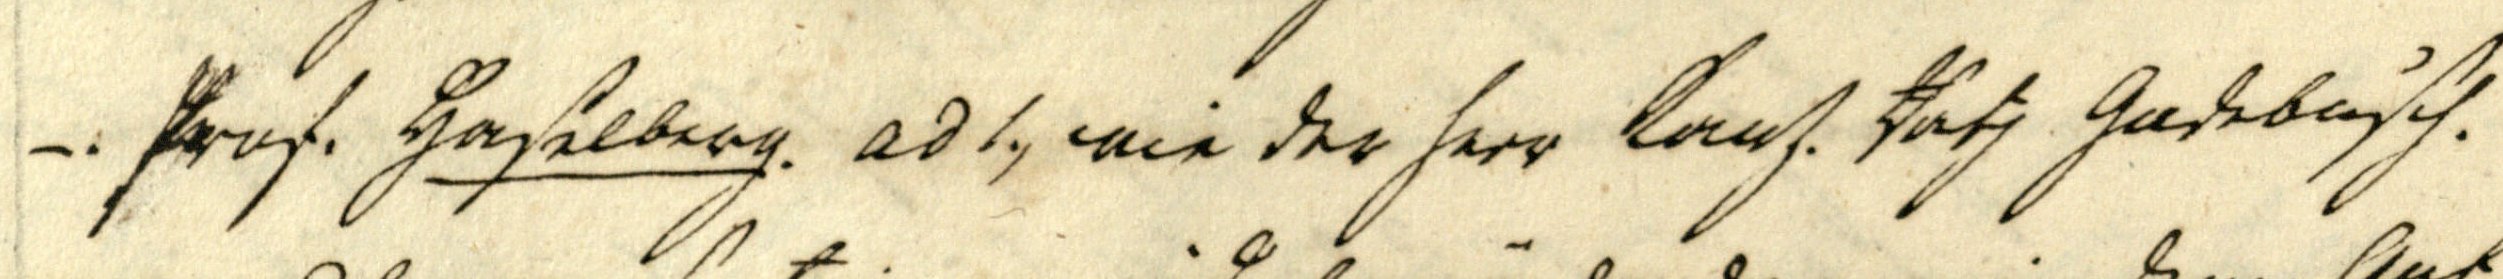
— " Prof. Haselberg. ad 1., wie der Herr Kanz. Rath Gadebusch.
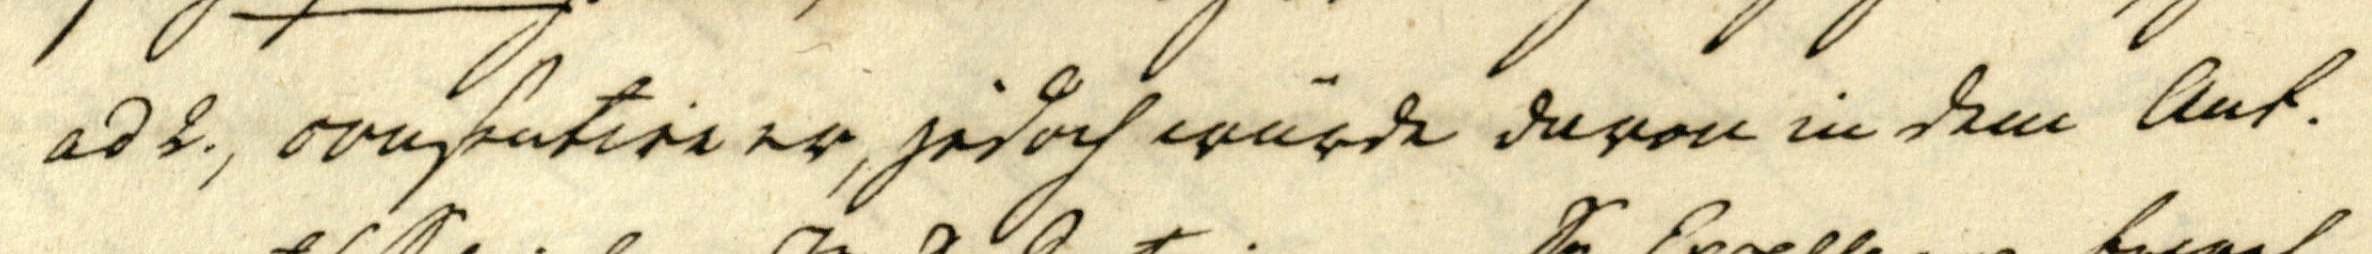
ad 2., consentire er, jedoch würde davon in dem Ant¬
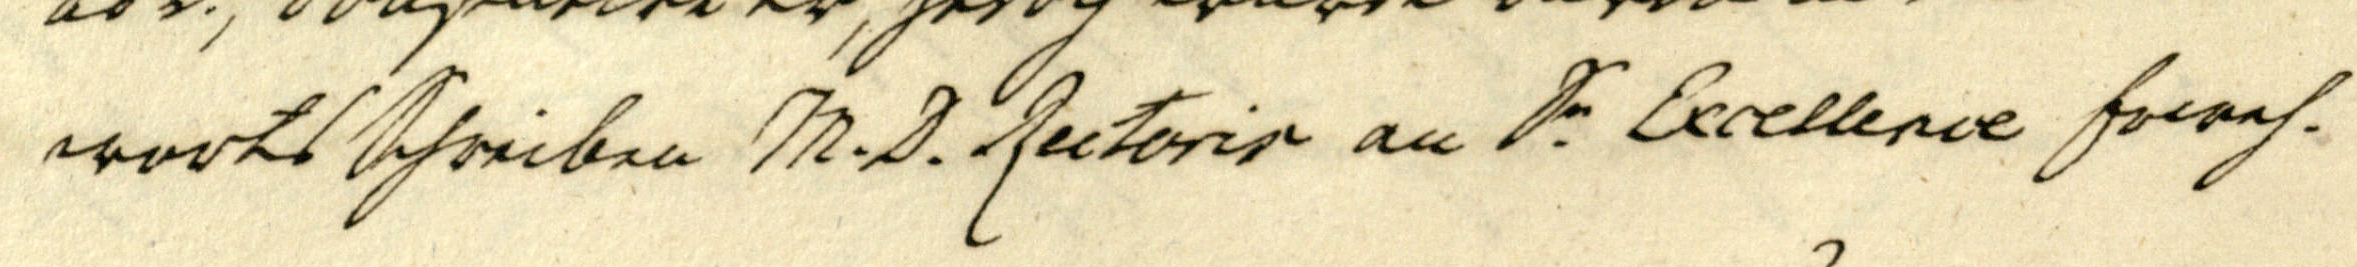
worts Schreiben M. D. Rectoris an Sr. Excellence Erweh¬
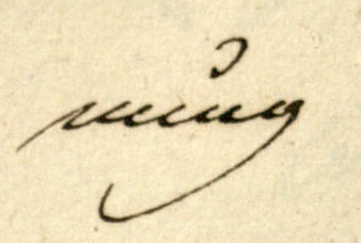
nung
